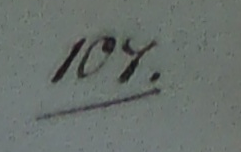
107.
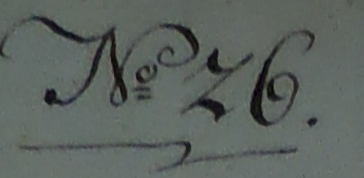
No͇ 26.
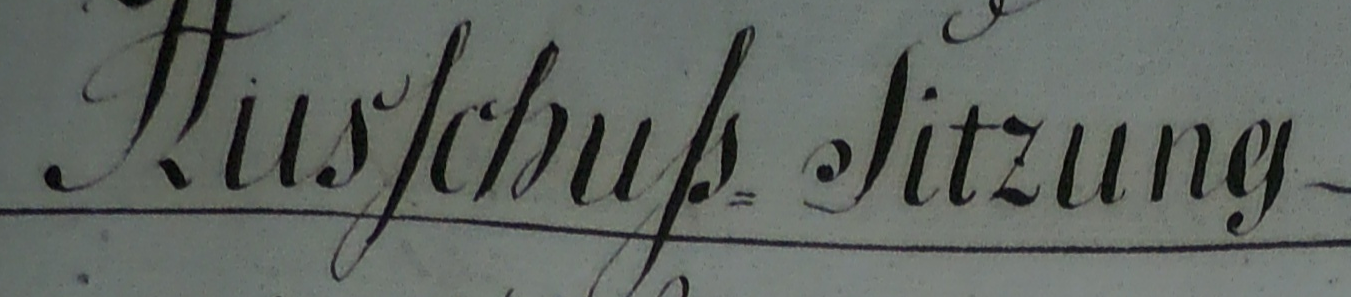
Ausschus‗Sitzung
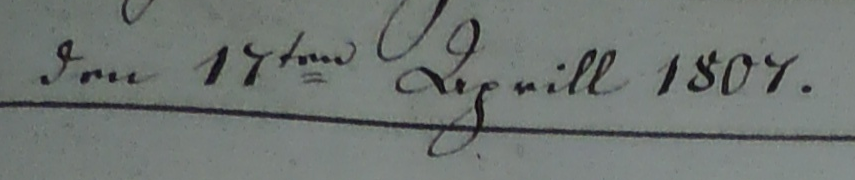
den 17te͇n Aprill 1807.
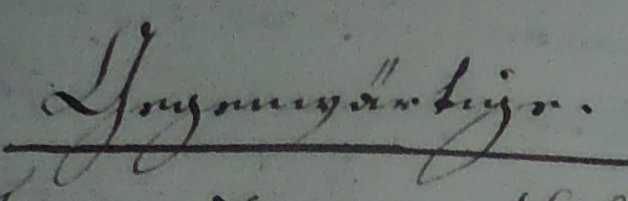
Gegenwärtige.
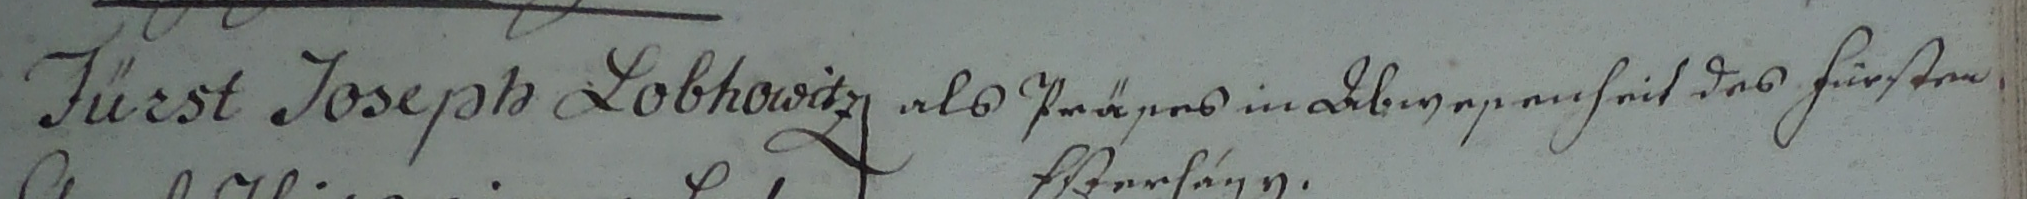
Fürst Joseph Lobkowitz als Präses in Abwesenheit des Fürsten
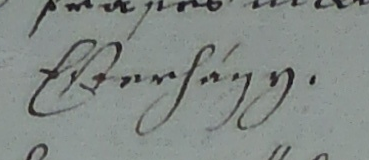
Eserhàzy.
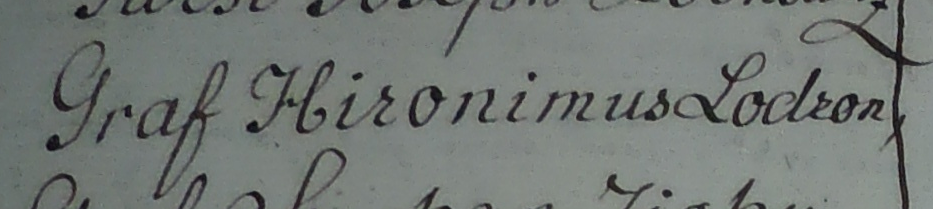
Graf Hironimus Lodron
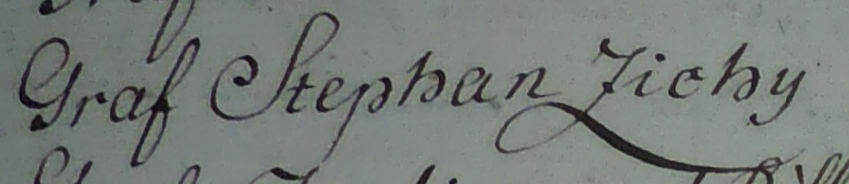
Graf Stephan Zichy
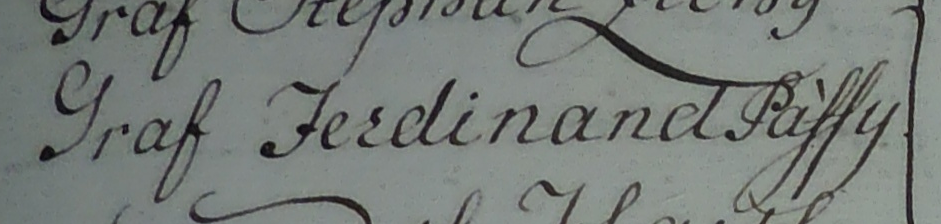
Graf Ferdinand Pàffy
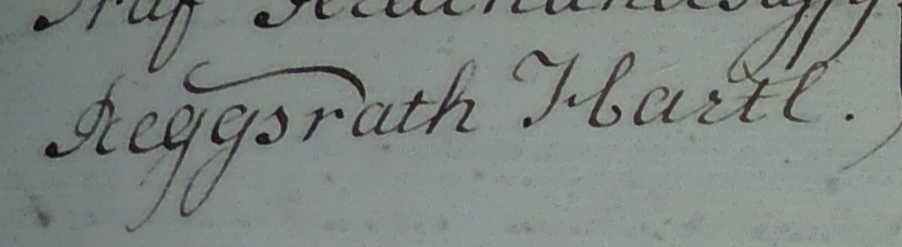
Reg͞gsrath Hartl
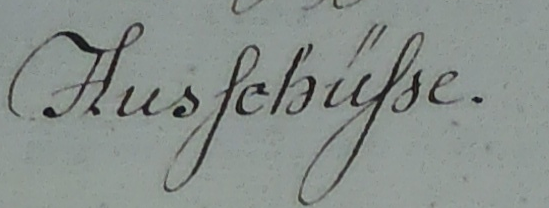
Ausschüsse.
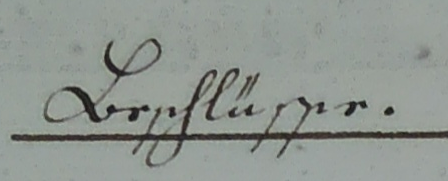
Beschlüsse.
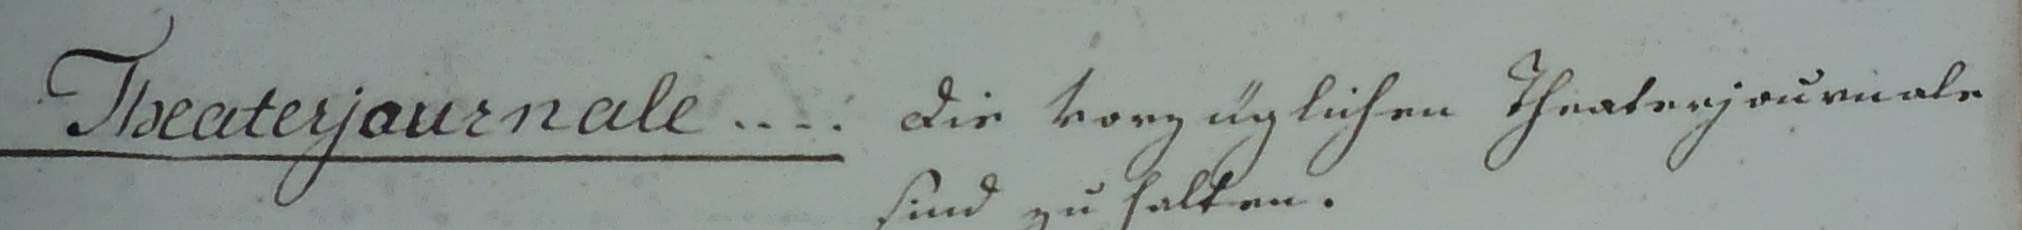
Theaterjournale . . . . Die vorzüglichen Theaterjournale
